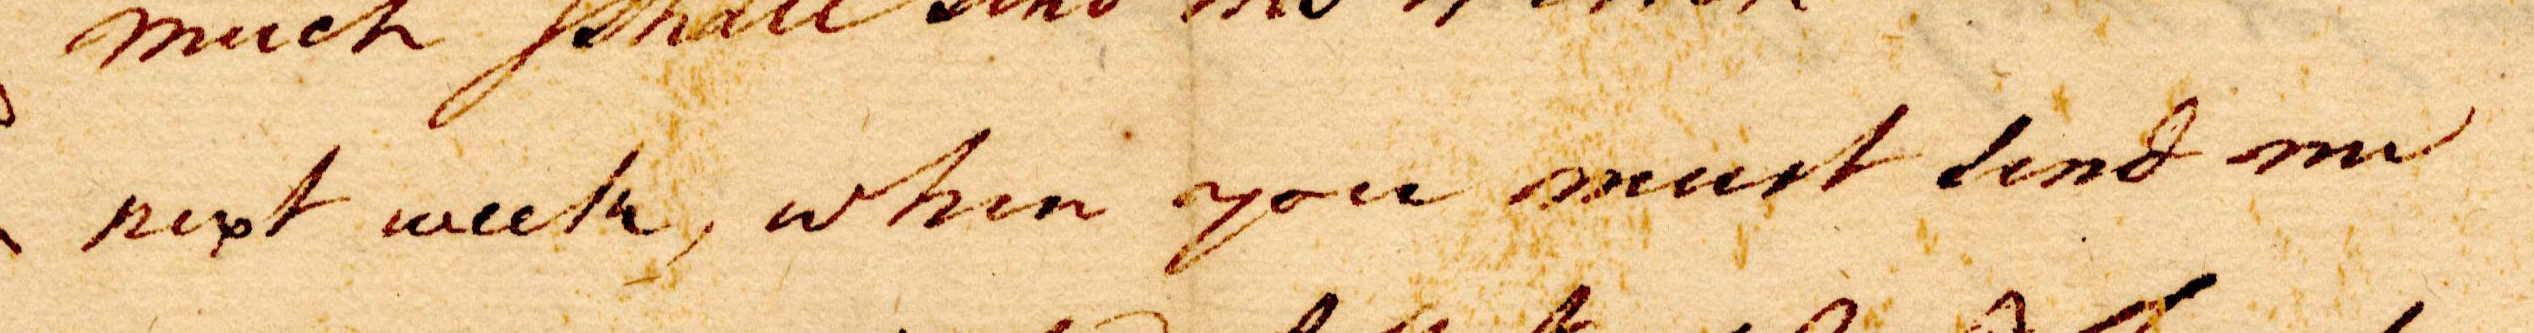next week, when you must Send me
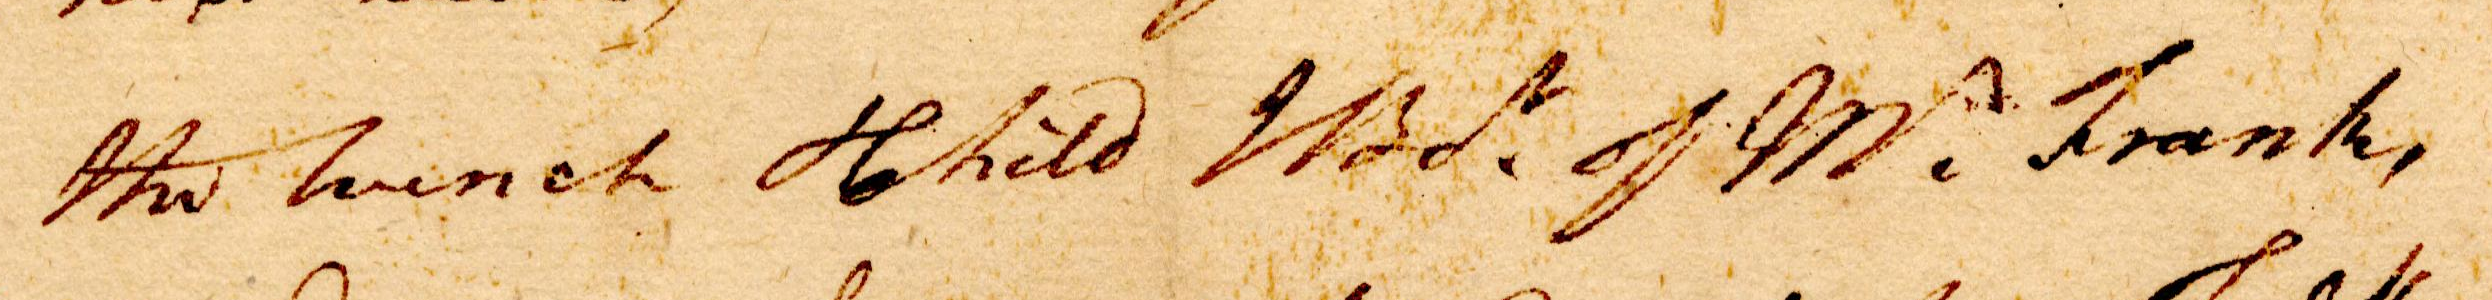the bench & Child I Bo^t. of M^r. Frank,
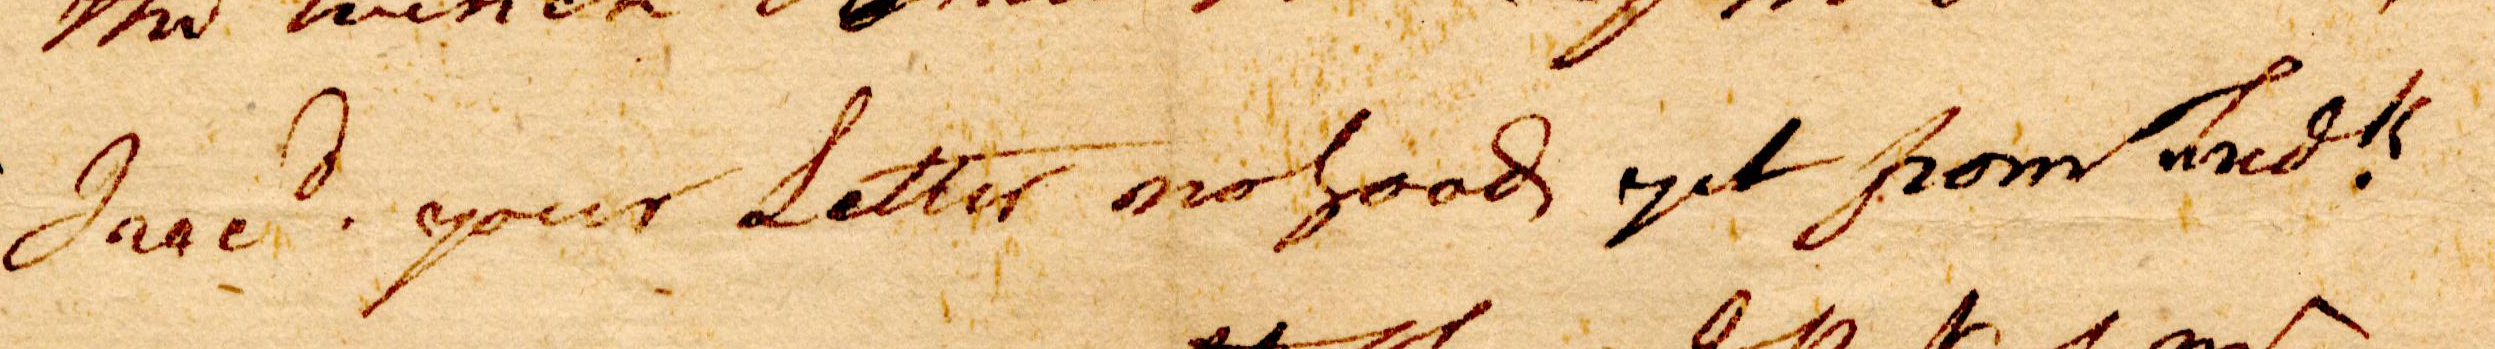I rec^d. your Letter no goods, yet from Fred^k.
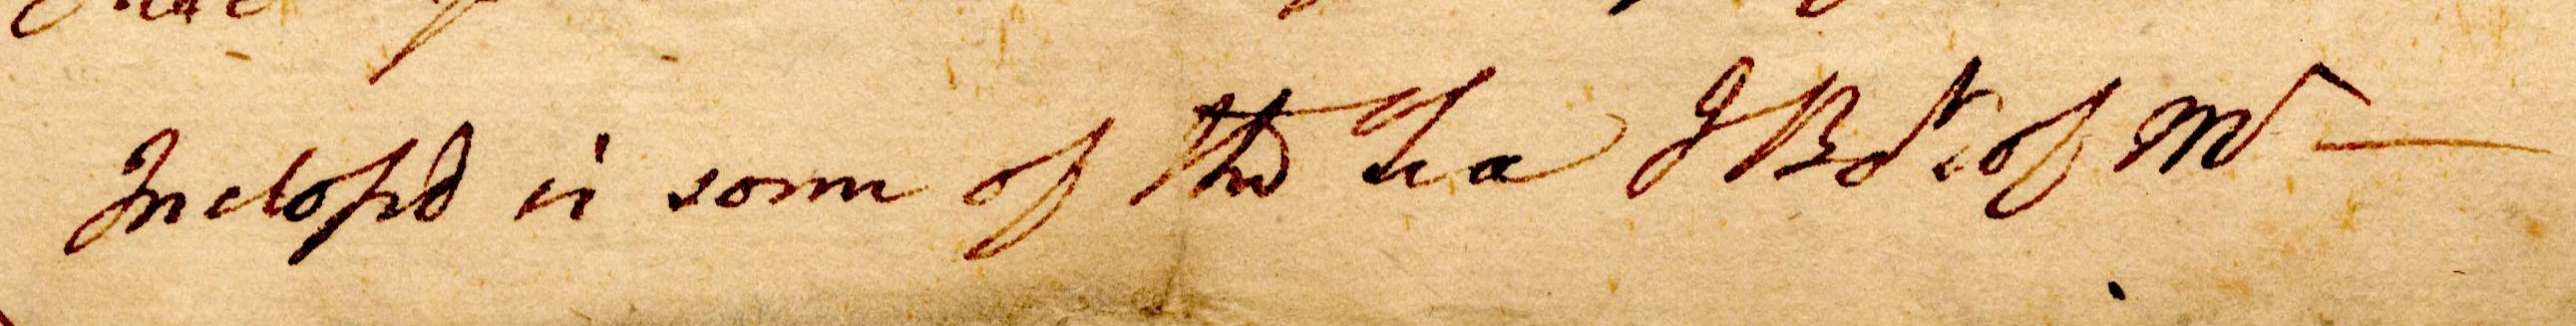Inclosd is some of the Tea I Bo^t. of M^r-
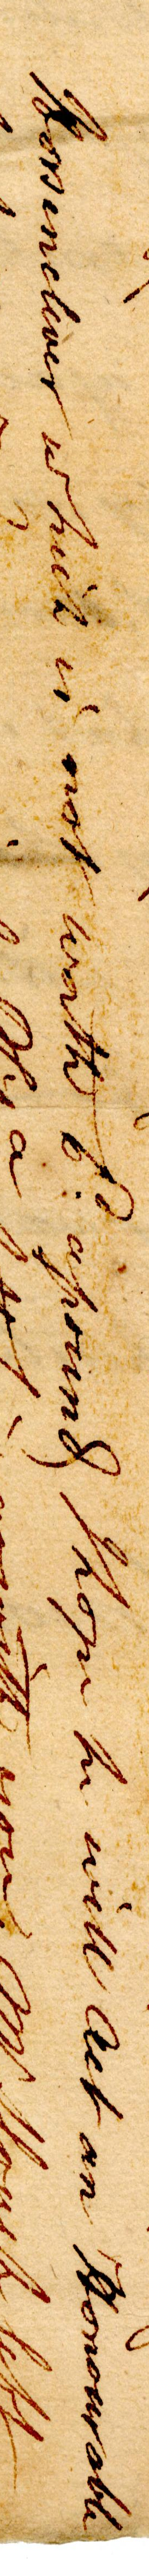Horsenclever which is not worth 6 ^d: a pound I hope he will act an Honourable
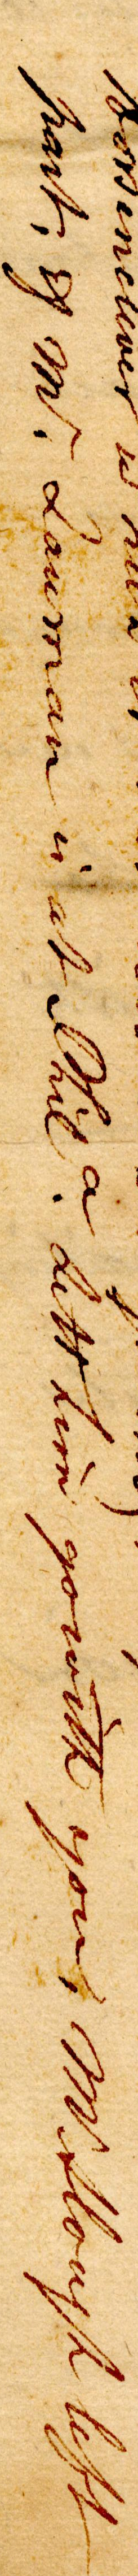part, of M^r. Laurnan is at Phil^a. Lett him go with you, M^r Slough left
